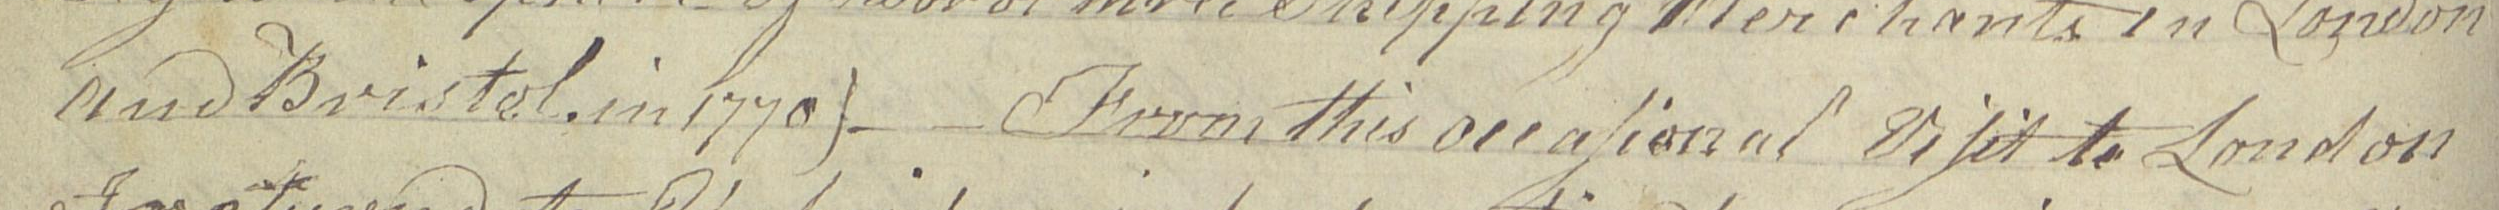and Bristol in 1770) From this occasional Visit to London
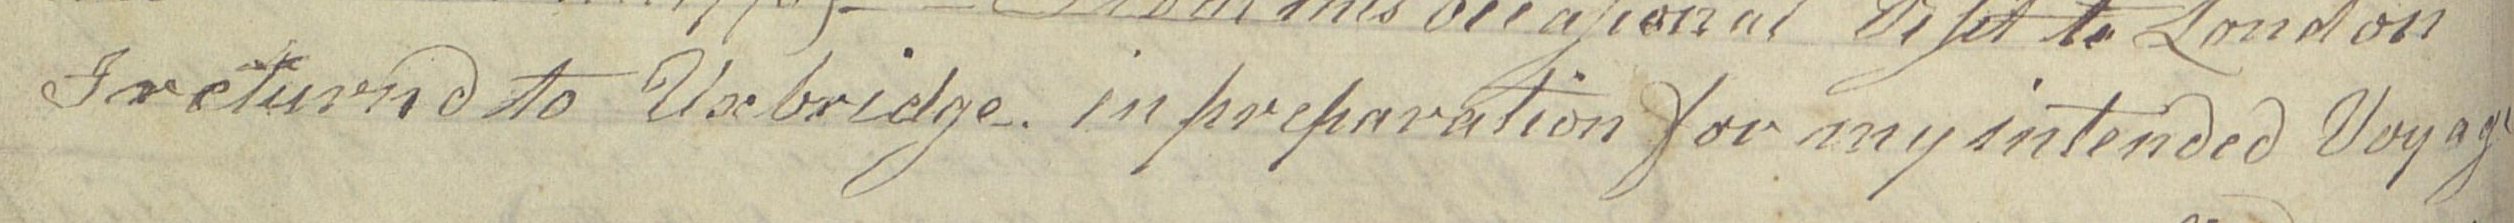I returnd to Uxbridge in preparation for my intended Voyage
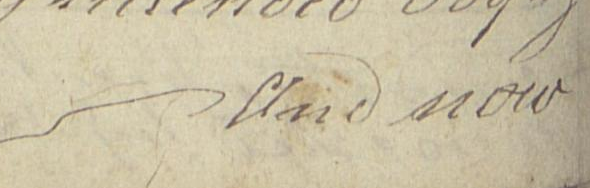And now
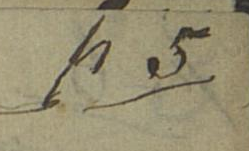p 5
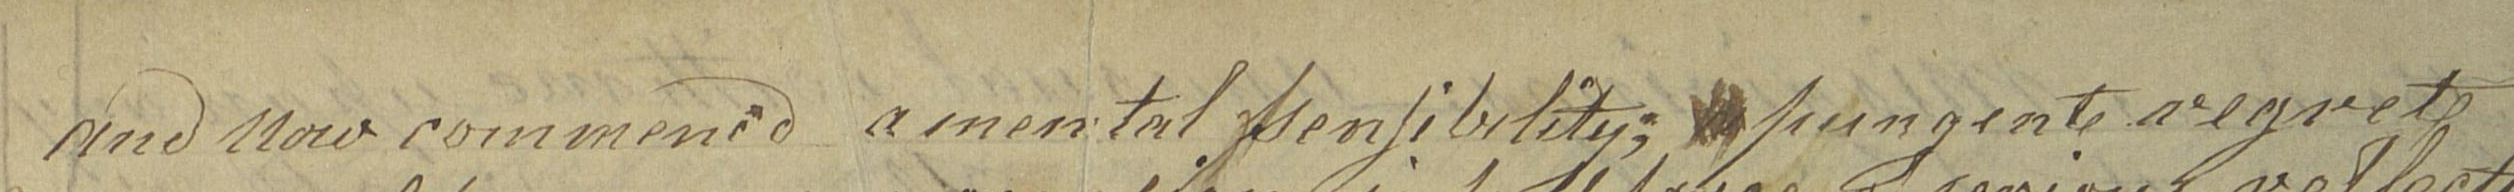and now commenc'd a mental sensiblity; & pungent regrets
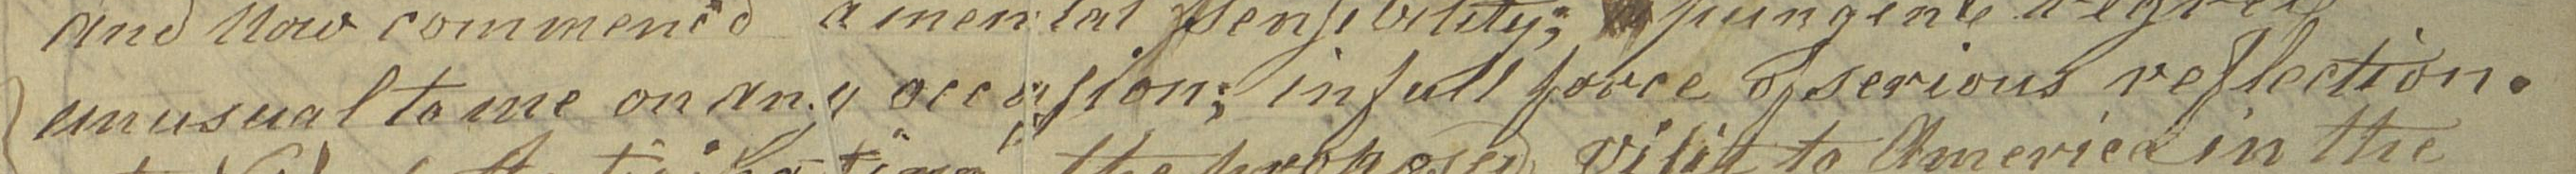unusual on any occasion; in full force of serious reflection.
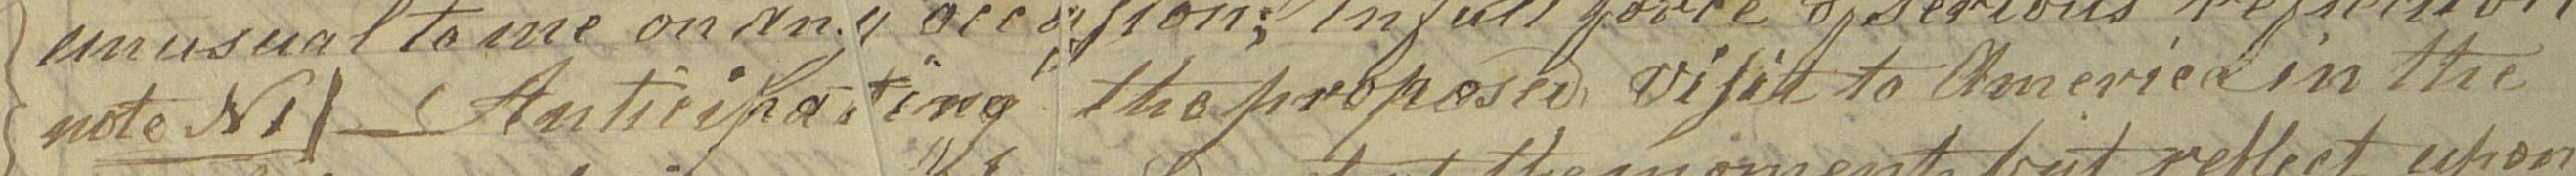note N11 Anticipating the proposed visit to America in the
